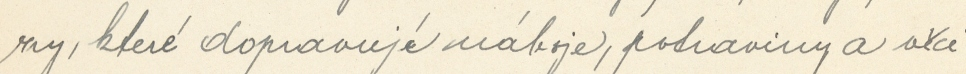zy, které dopravují náboje, potraviny a věci
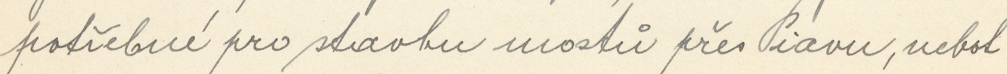potřebné pro stavbu mostů přes Piavu, neboť
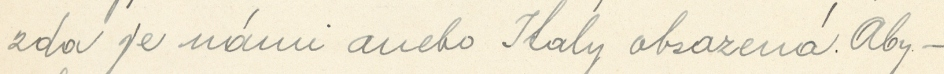zda je námi anebo Italy obsazená. Aby-
